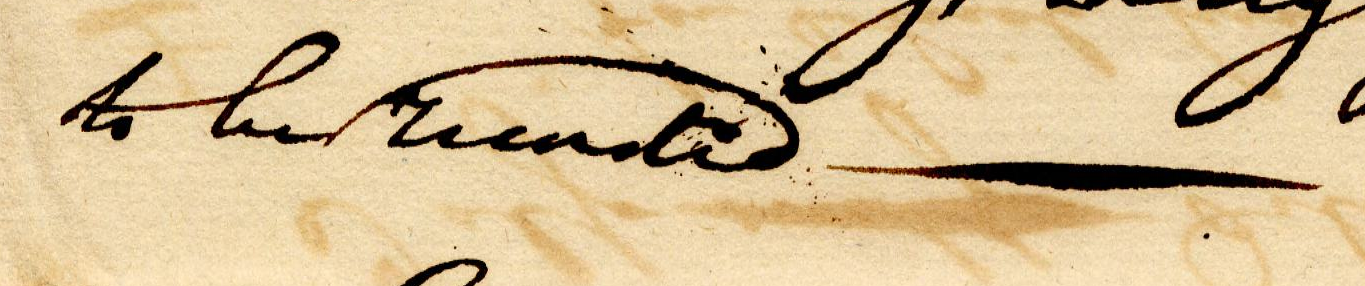to be recorded-
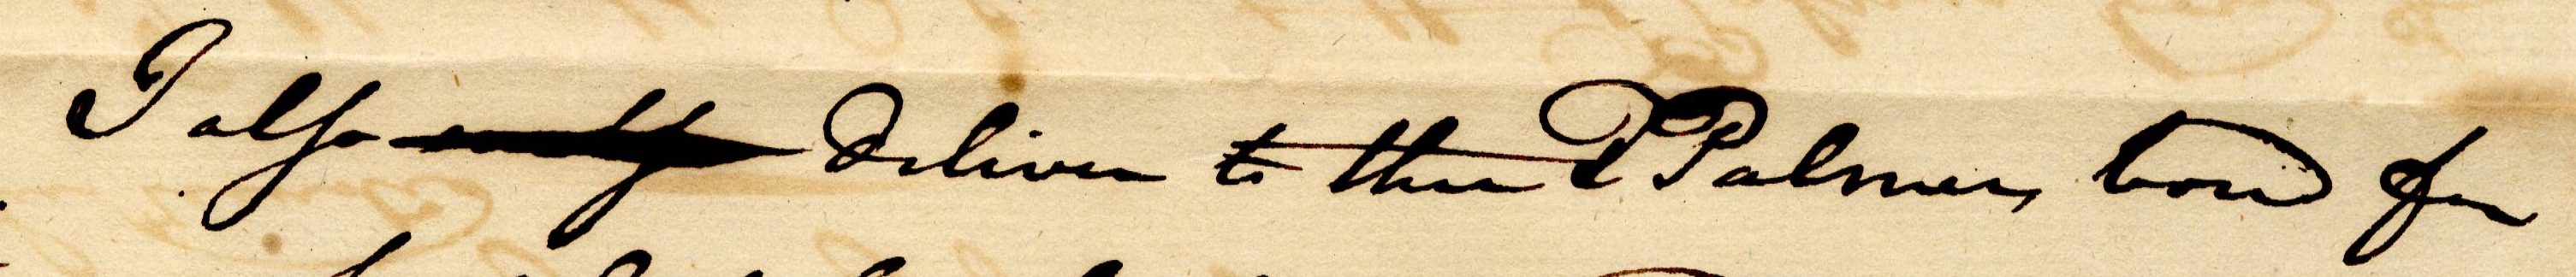I also [_______] deliver to thee T Palmers bond for
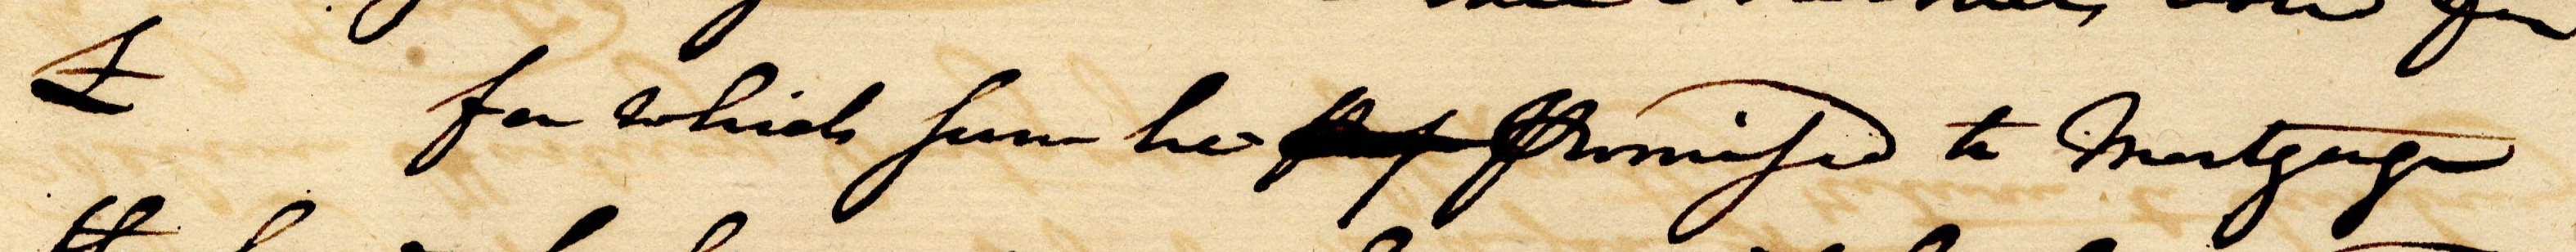£ for which sum he [___] permised to mortgage
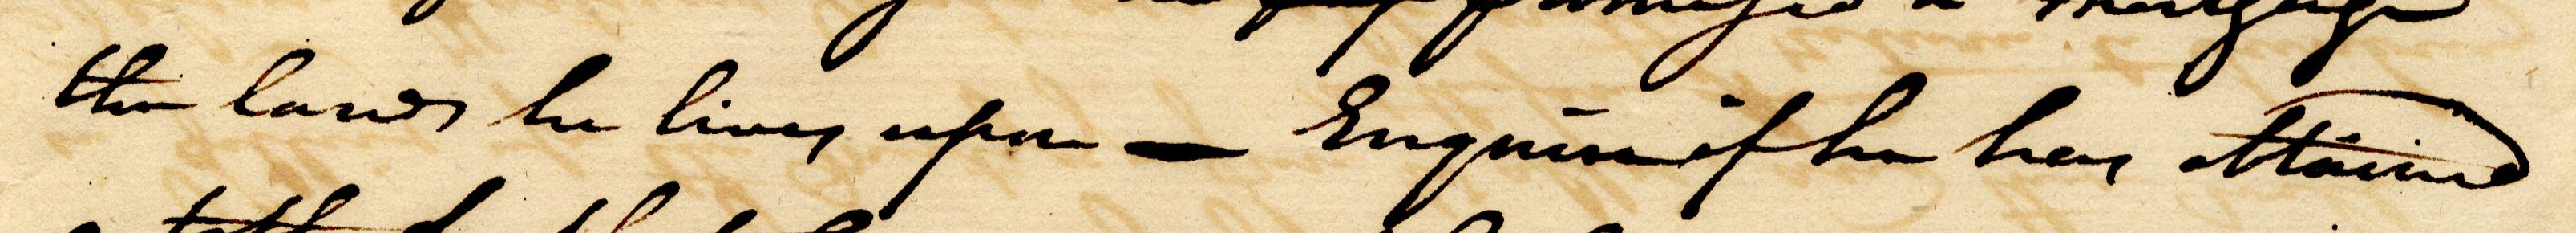the lands he lives upon- Enquire if he has obtained
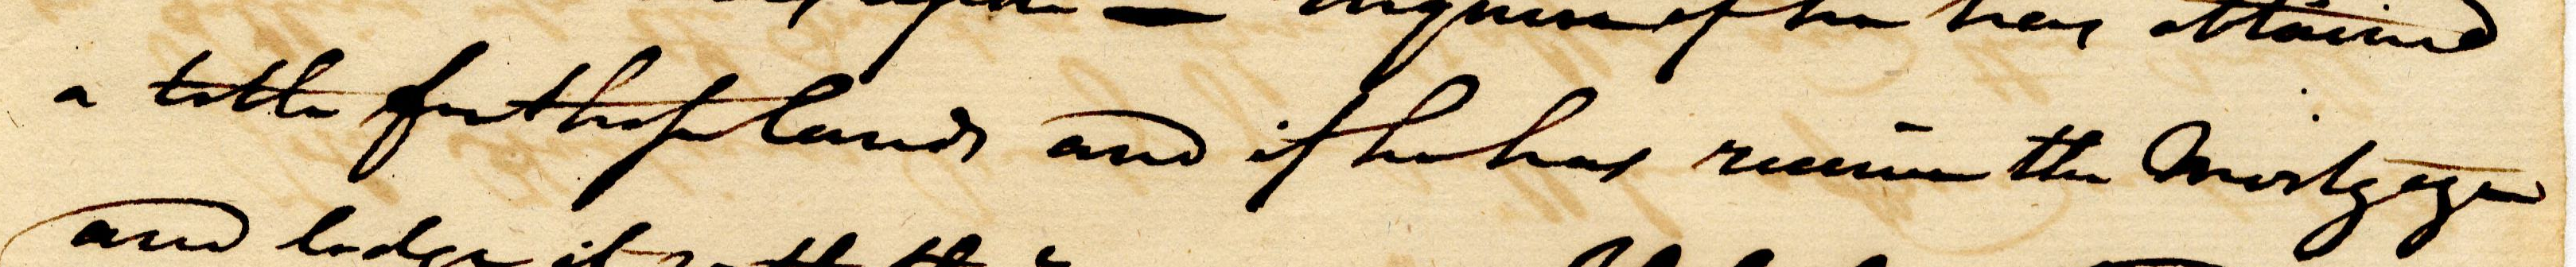a title for those lands and if he has receive the mortgage
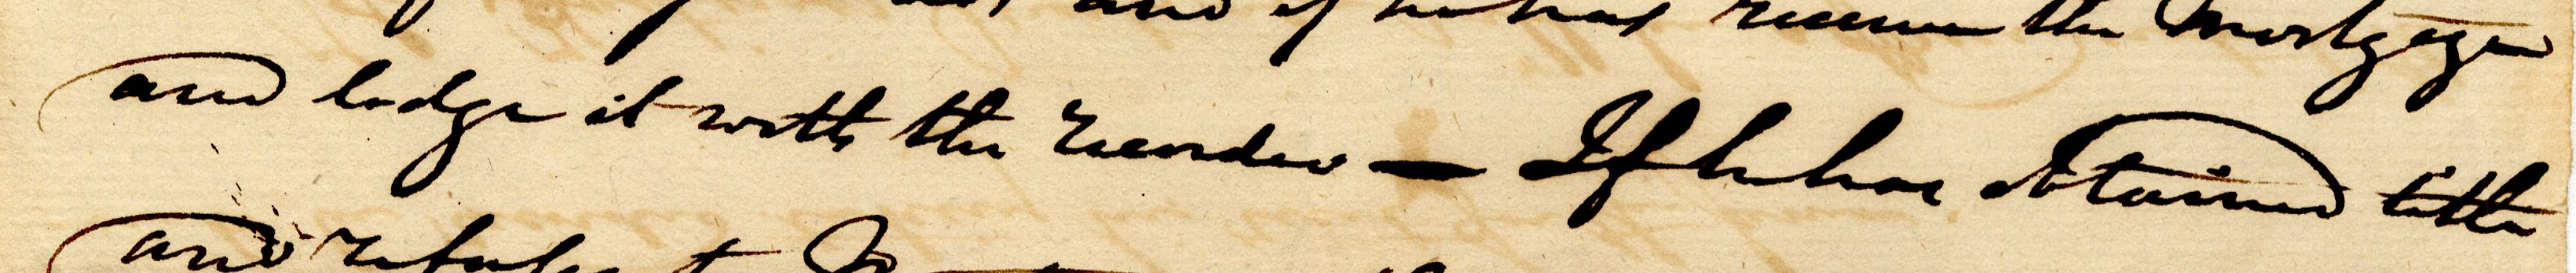and lodge it with the riender- If he has obtained title
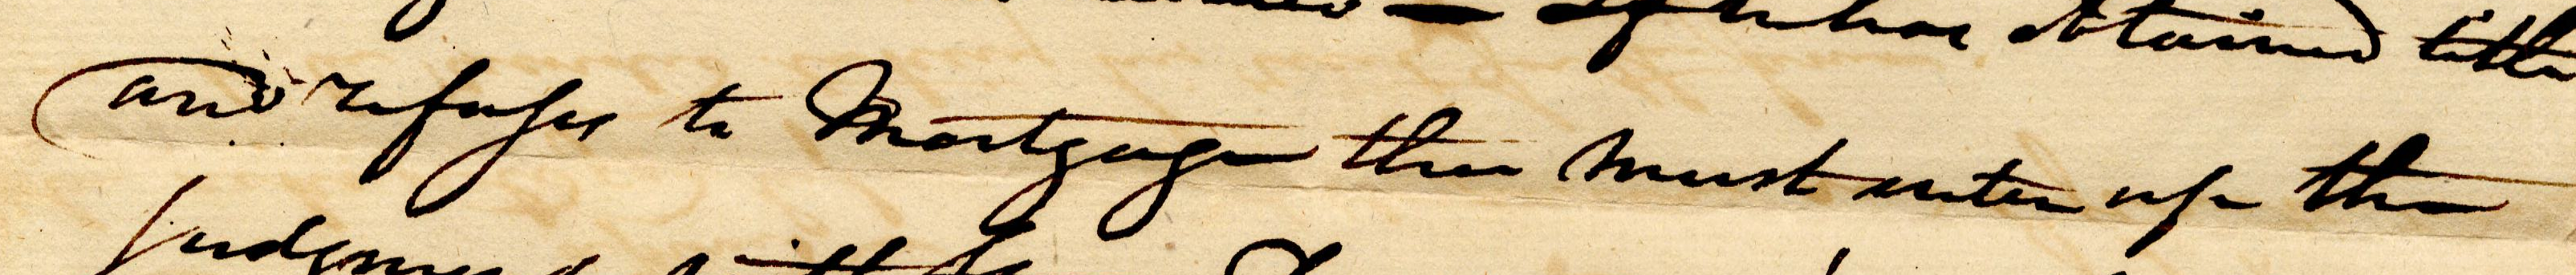and refuses to mortgage this must enter up the
